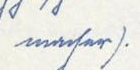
macher)
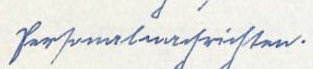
Personalnachrichten
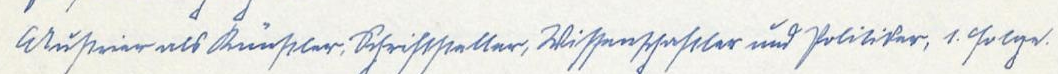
Austrier als Künstler, Schriftsteller, Wissenschaftler und Politiker, 1. Folge
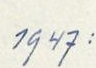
1947:
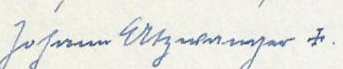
Johann Atzwanger +
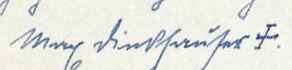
Max Dinkhauser +
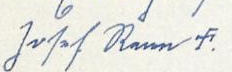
Josef Renn +
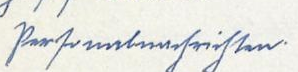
Personalnachrichten
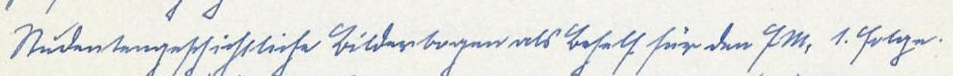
Studentengeschichtliche Bilderbogen als Behelf für den FM, 1. Folge
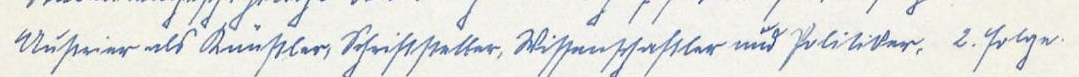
Austrier als Künstler ,Schriftsteller, Wissenschaftler und Politiker, 2. Folge
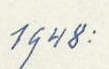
1948:
